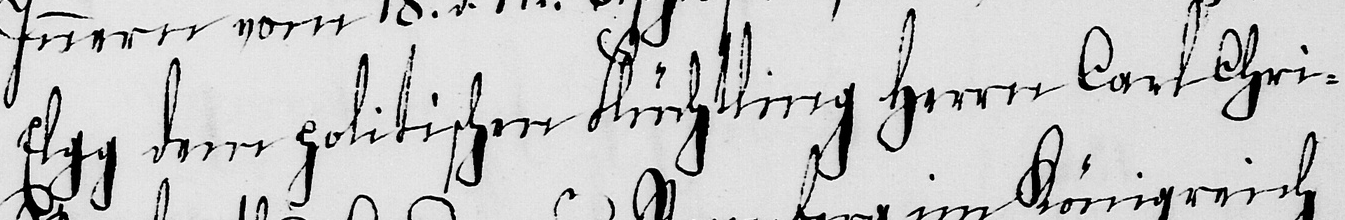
Elgg dem politischen Flüchtling Herrn Carl Chri¬
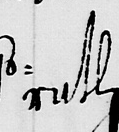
rath
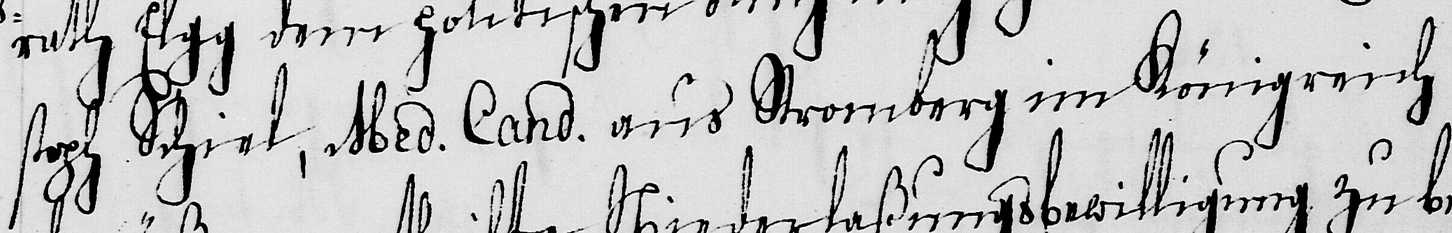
stoph Schiel, Med. Cand. aus Stromberg im Königreich
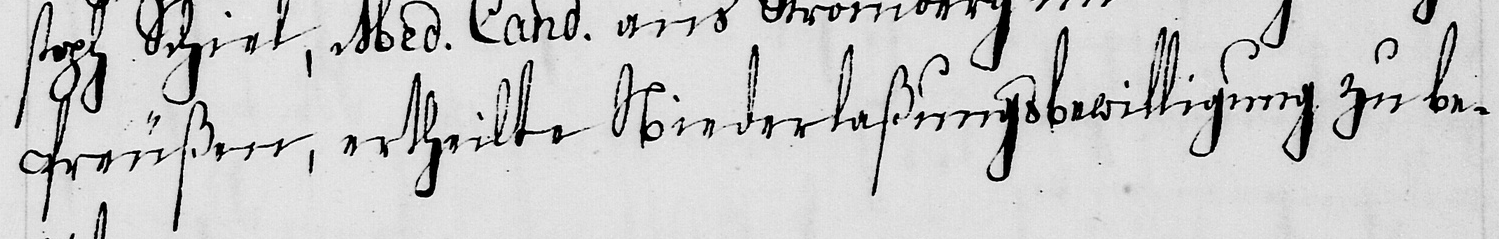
Preußen, ertheilte Niederlaßungsbewilligung zu be¬
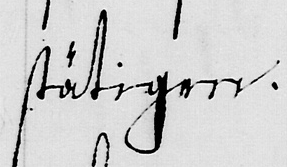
stätigen.
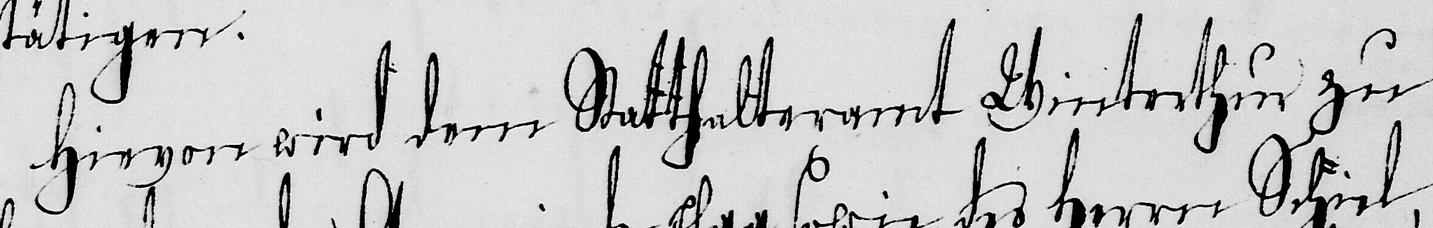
Hievon wird dem Statthalteramt Winterthur zu
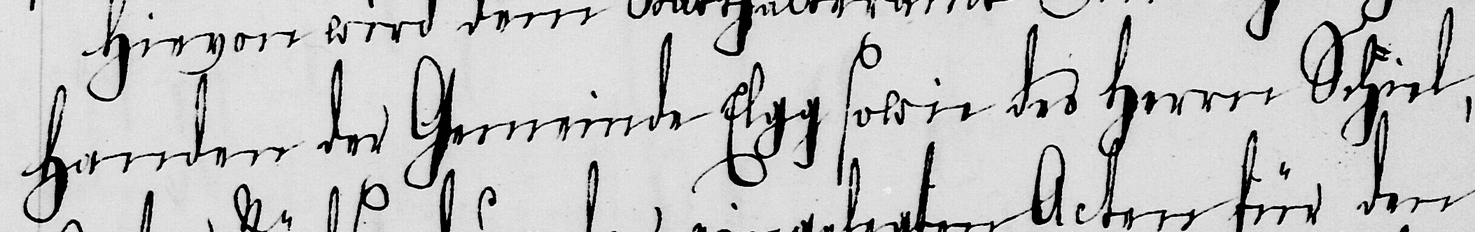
Handen der Gemeinde Elgg sowie des Herrn Schiel,
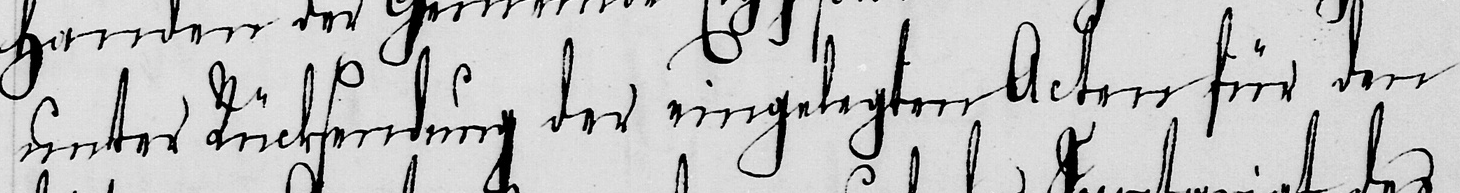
unter Rücksendung der eingelegten Acten für den
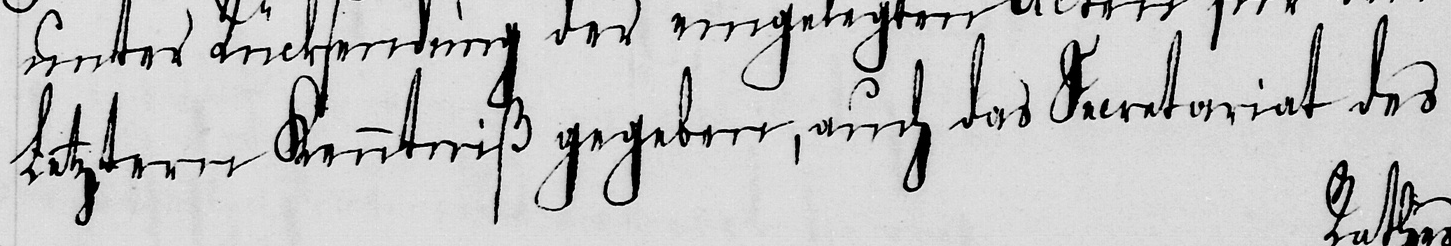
Letzteren Kenntniß gegeben, auch das Secretariat des
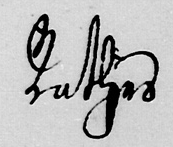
Rathes
